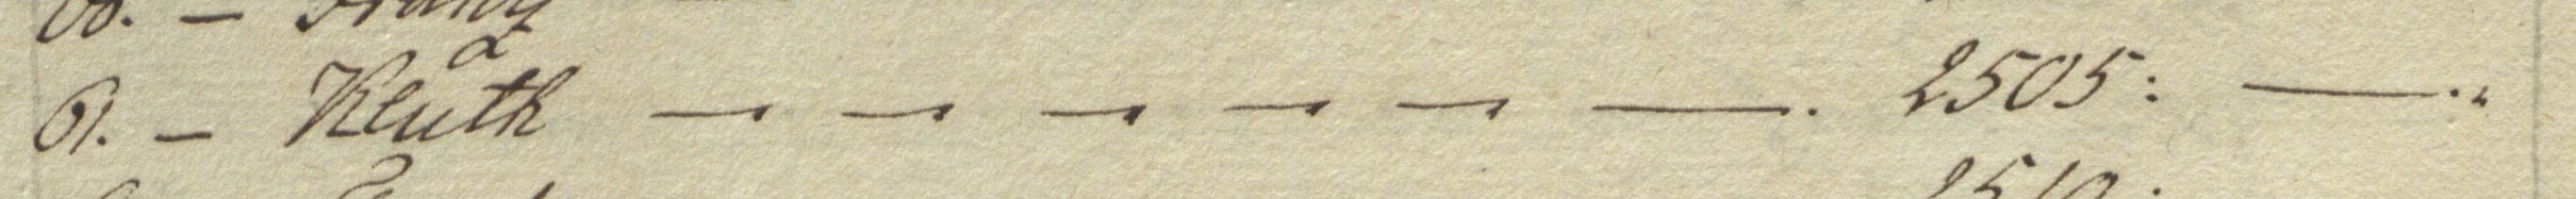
61. Kluth 2505:
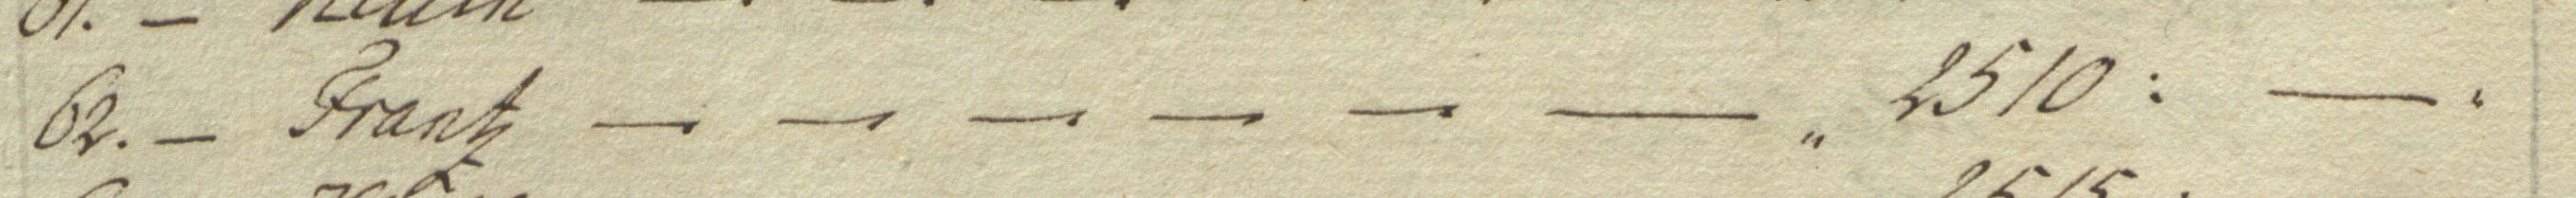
62. Frantz 2510:
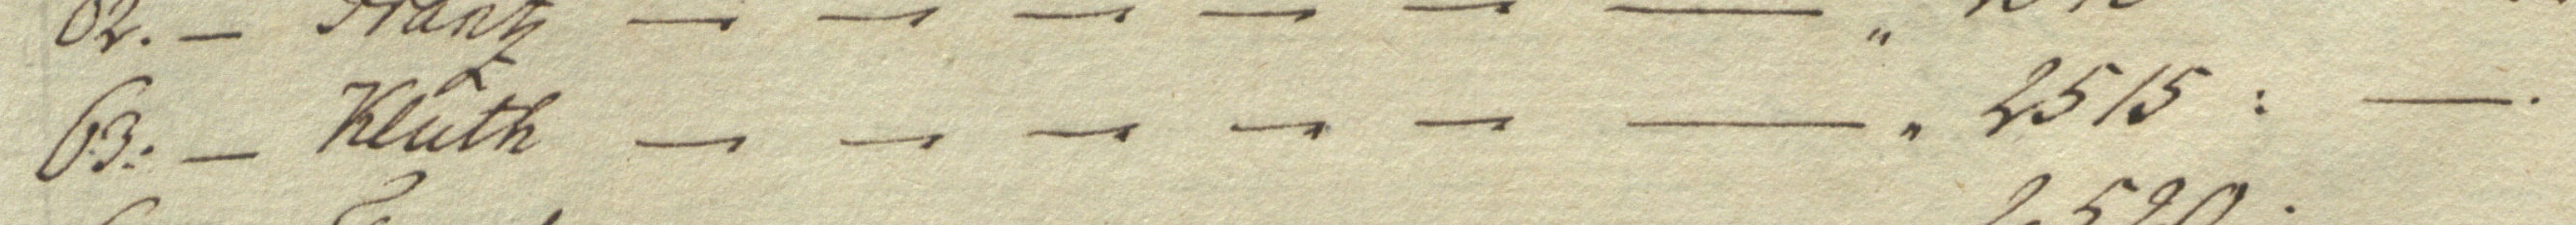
63. Kluth 2515:
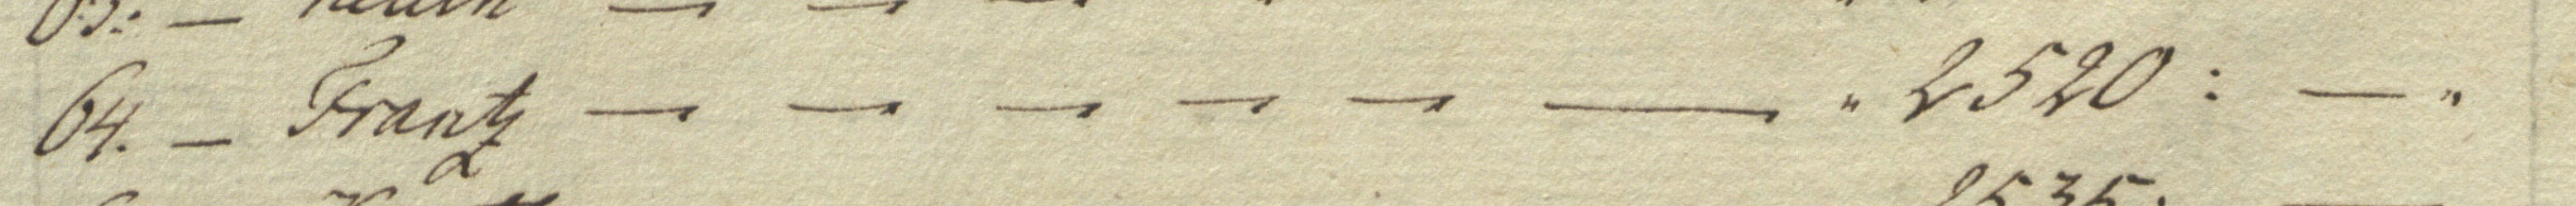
64. Frantz 2520:
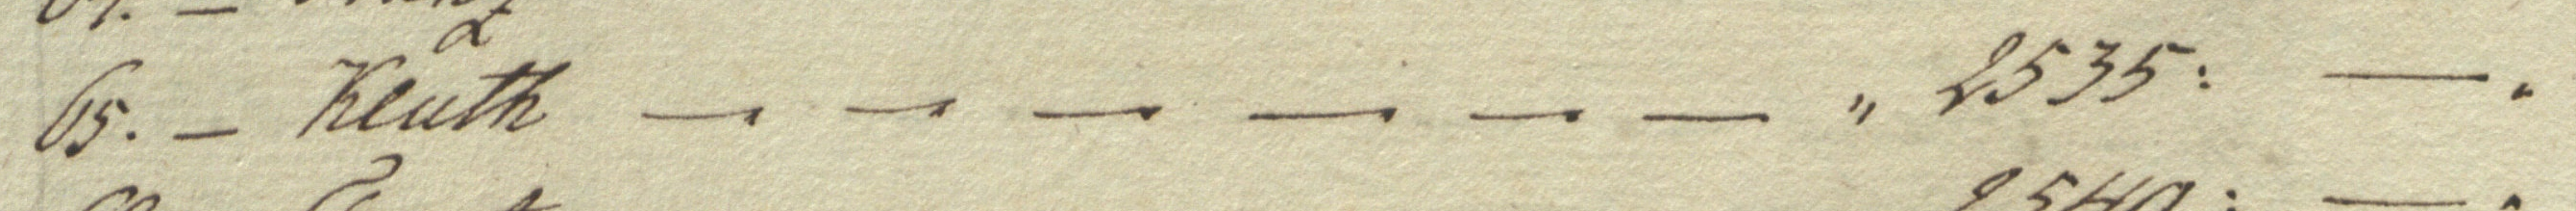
65. Kluth 2535:
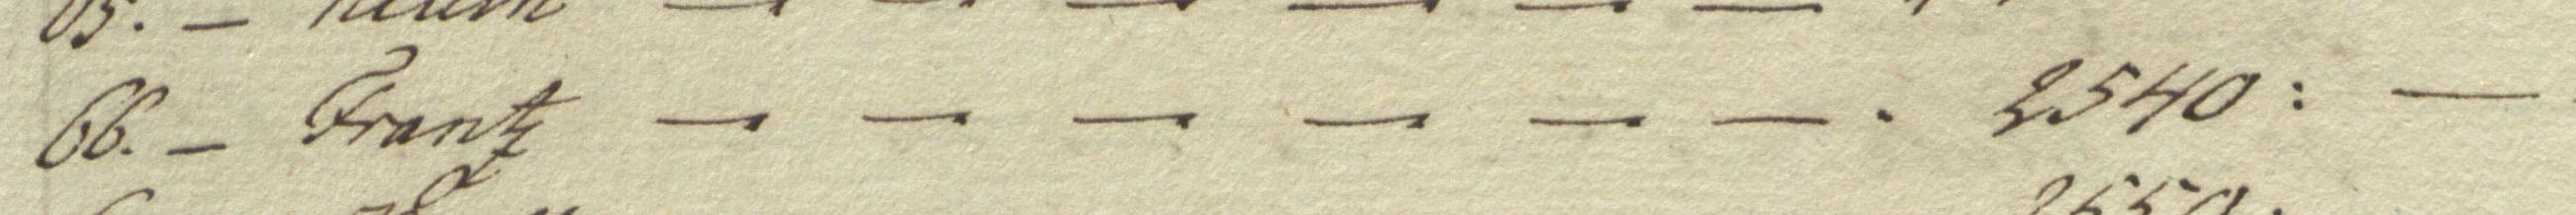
66. Frantz 2540:
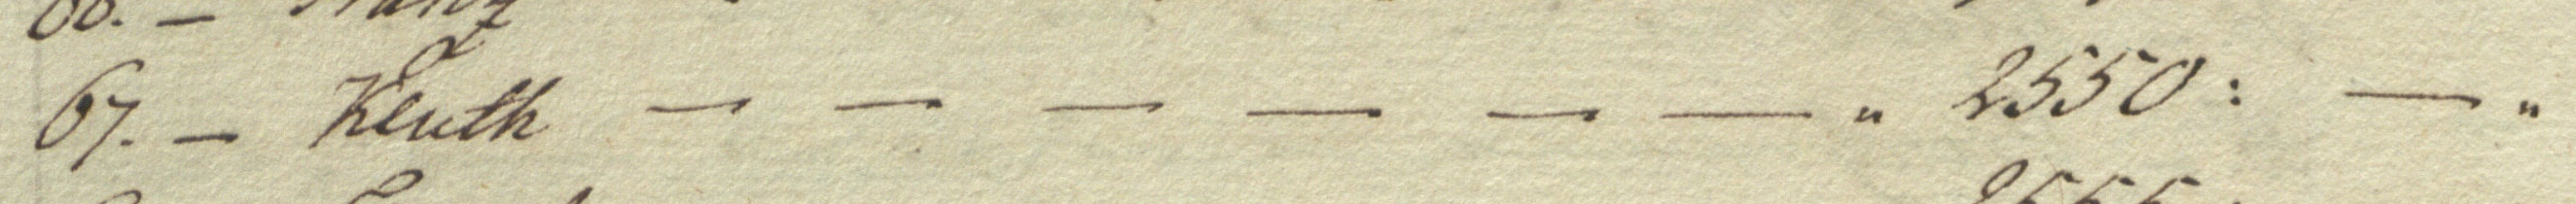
67. Kluth 2550:
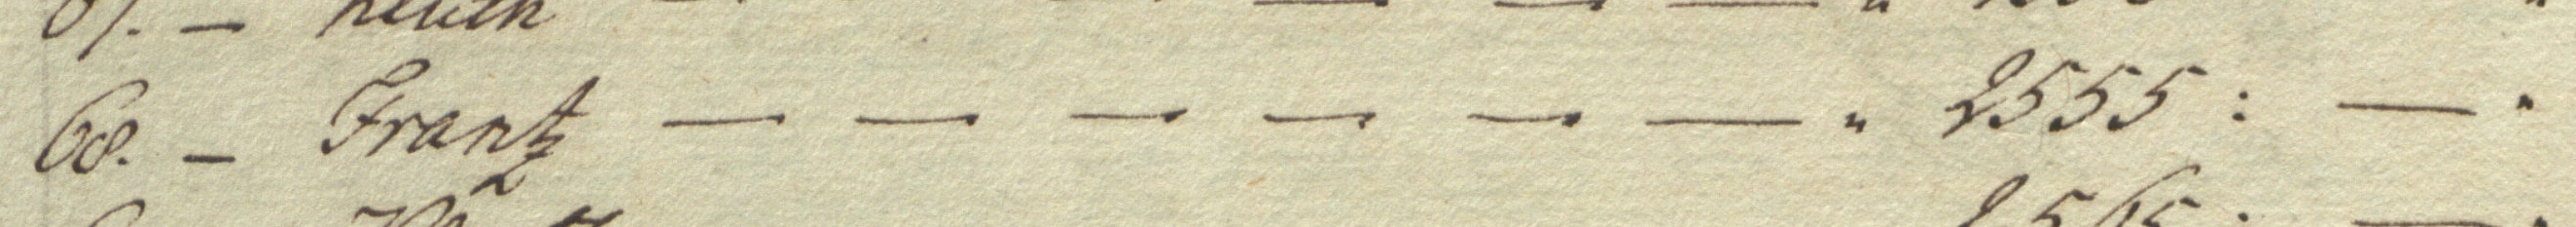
68. Frantz 2555:
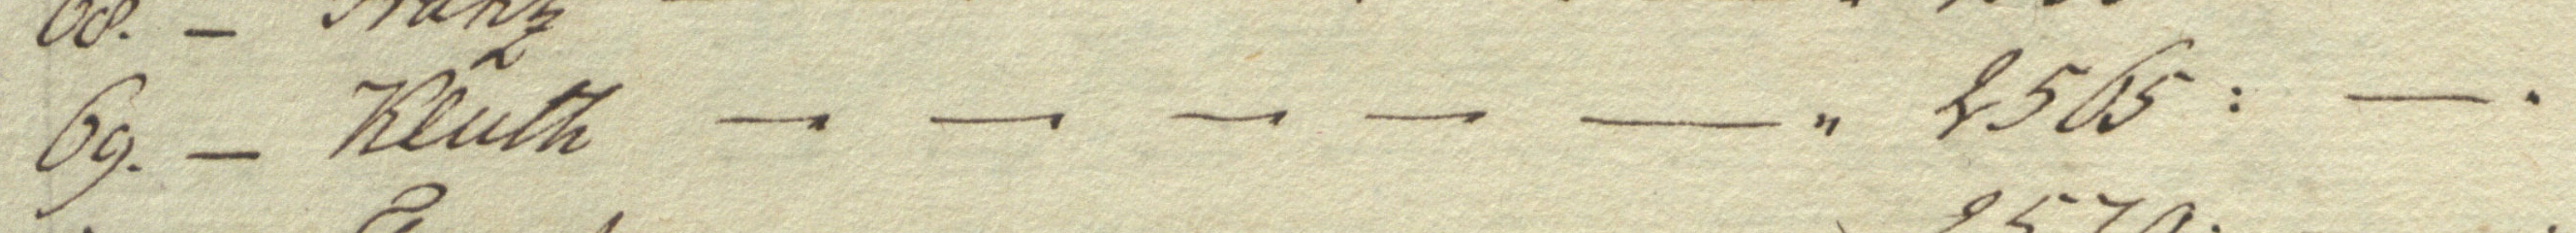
69. Kluth 2565:
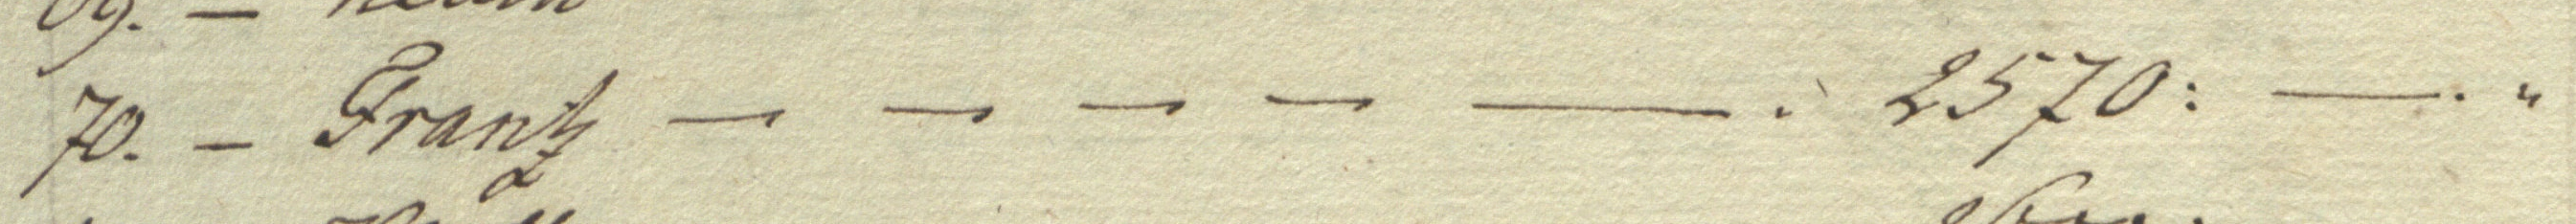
70. Frantz 2570:
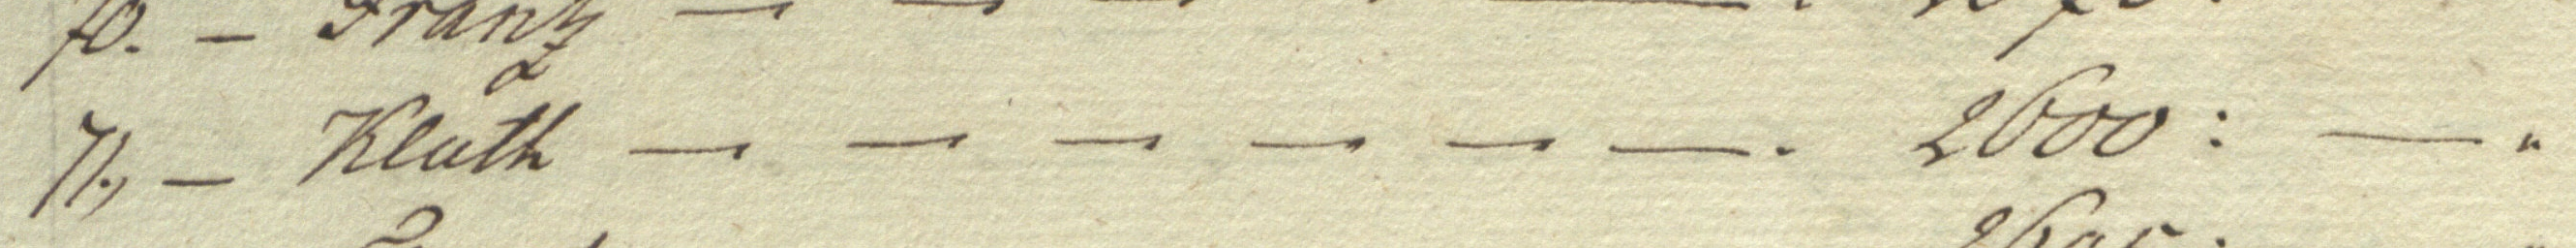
71., Kluth 2600:
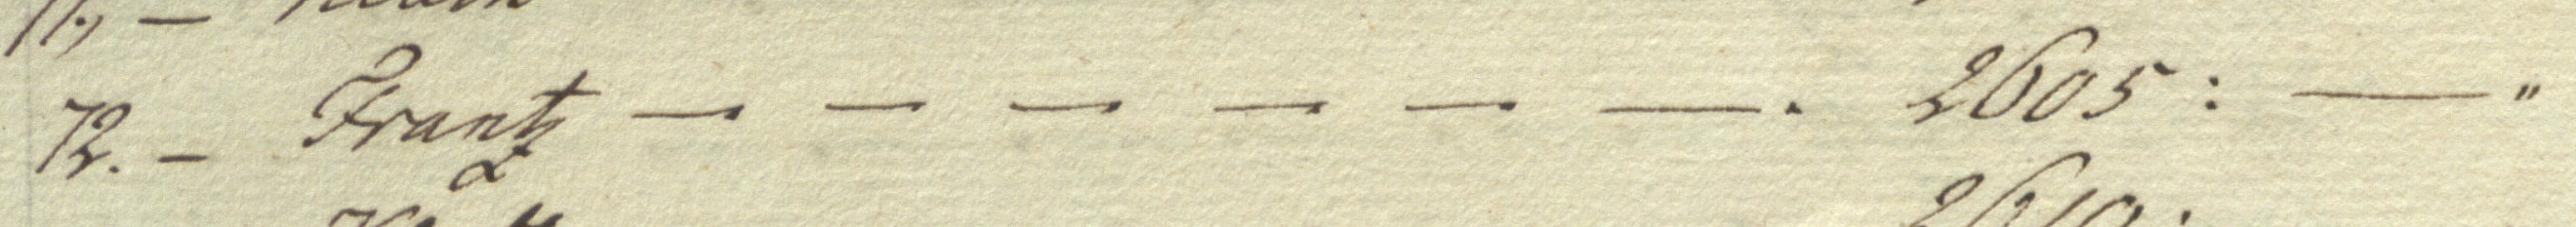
72. Frantz 2605:
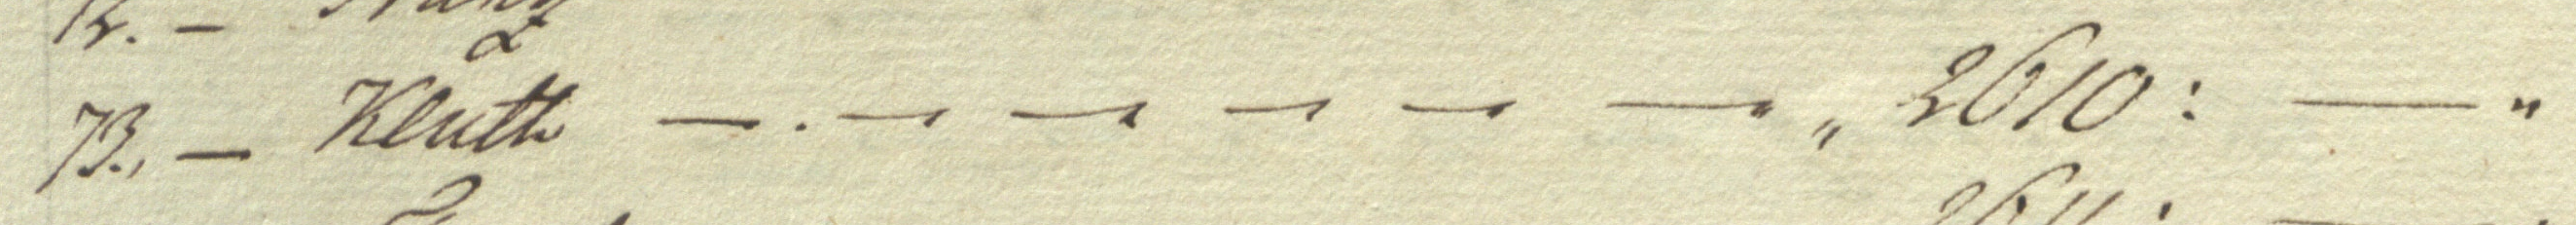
73., Kluth 2610:
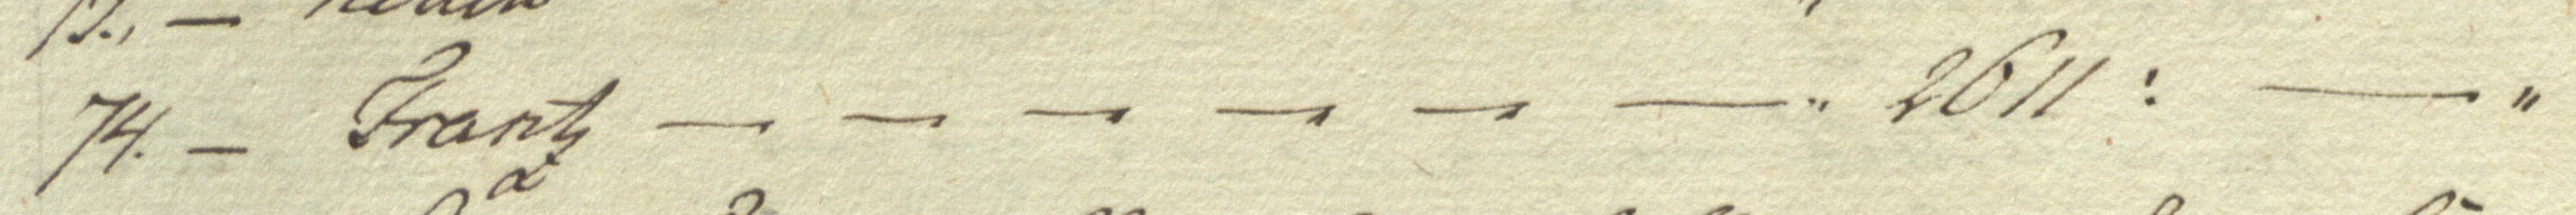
74. Frantz 2611:
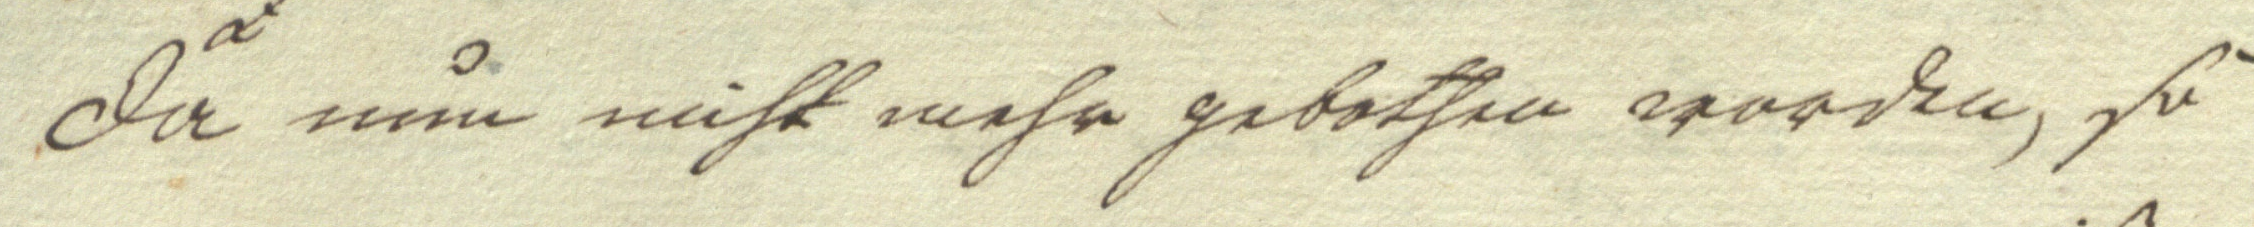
Da nun nicht mehr gebothen worden, so
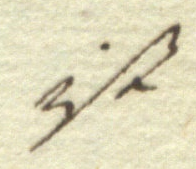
ist
